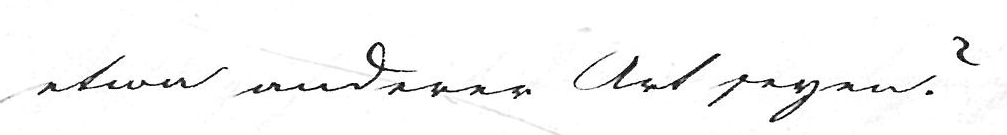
etwa anderer Art seyen?
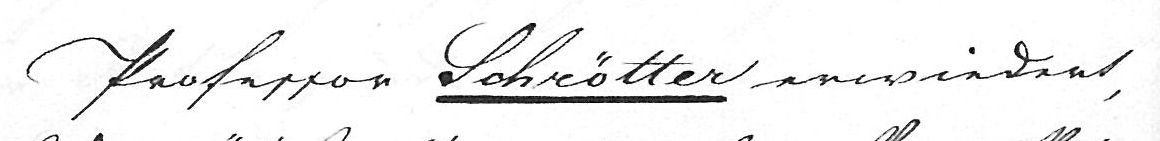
Professor Schrötter erwiedert,
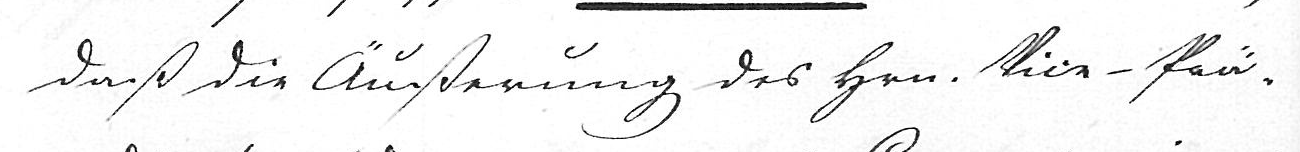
daß die Äußerung des Hrn. Vice-Prä-
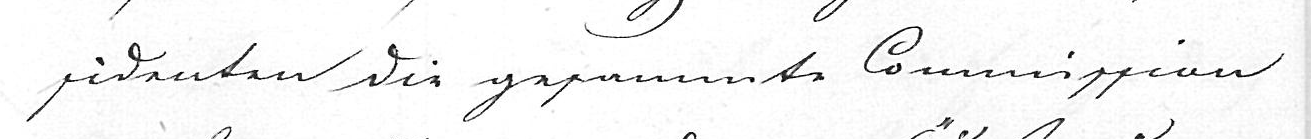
sidenten die gesammte Commission
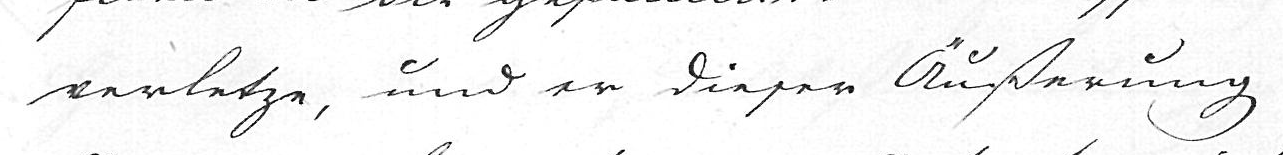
verletze, und er dieser Äußerung
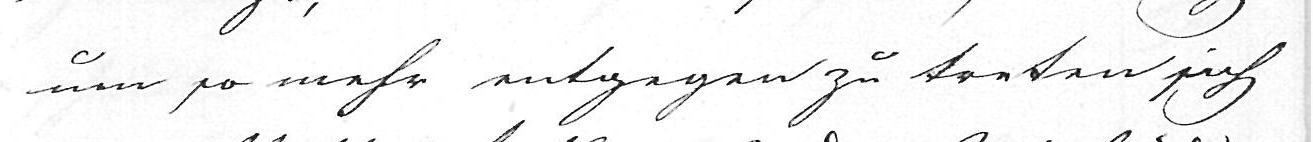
um so mehr entgegen zu treten sich
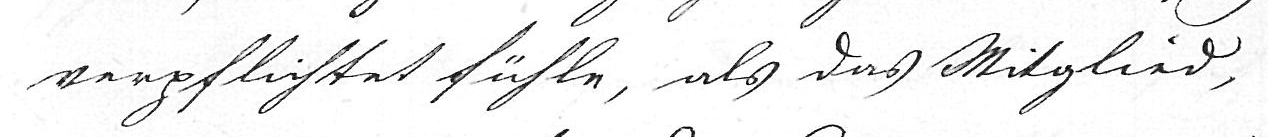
verpflichtet fühle, als das Mitglied,
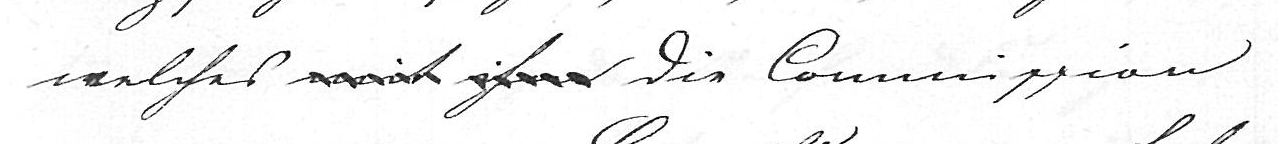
welches mit ihm die Commission
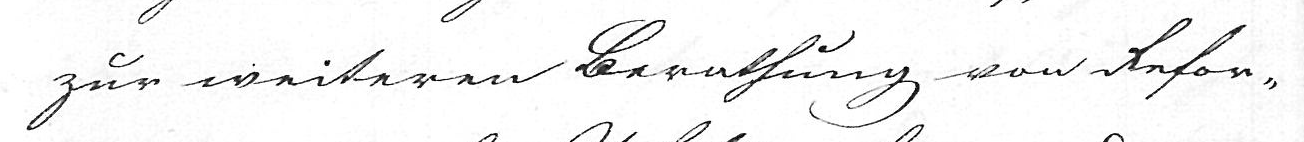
zur weiteren Berathung von Refor-
